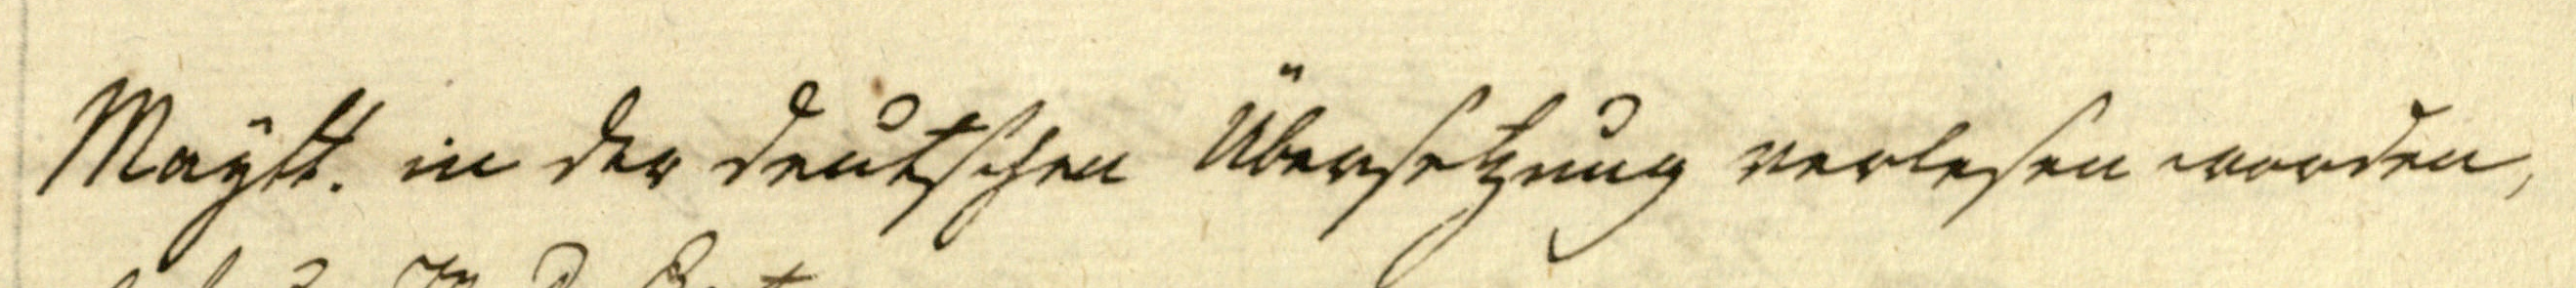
Maÿtt. in der deutschen Übersetzung verlesen worden,
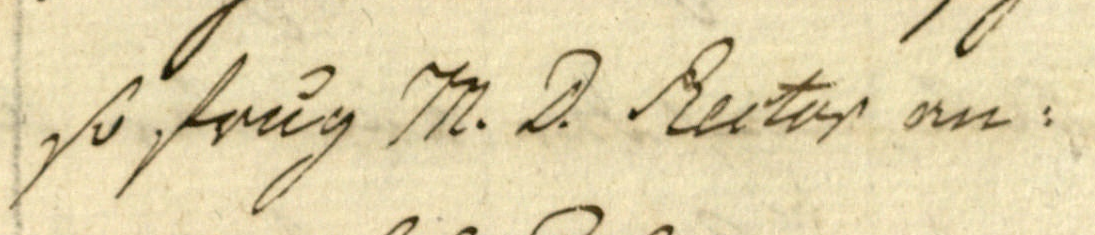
so frug M. D. Rector an:
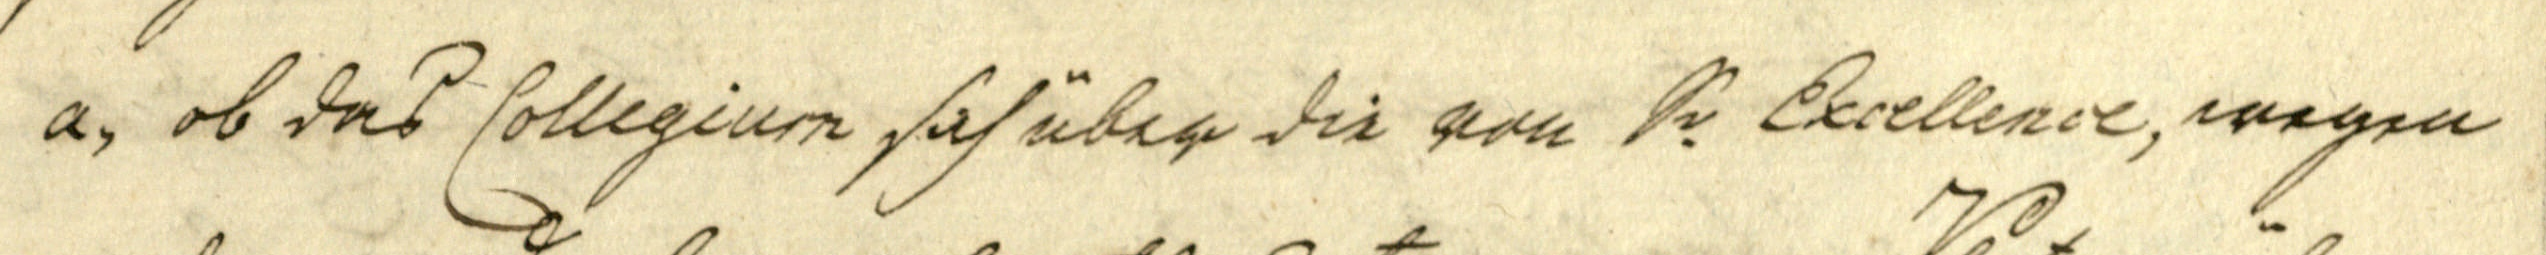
a, ob das Collegium sich über die von Sr. Excellence, wegen
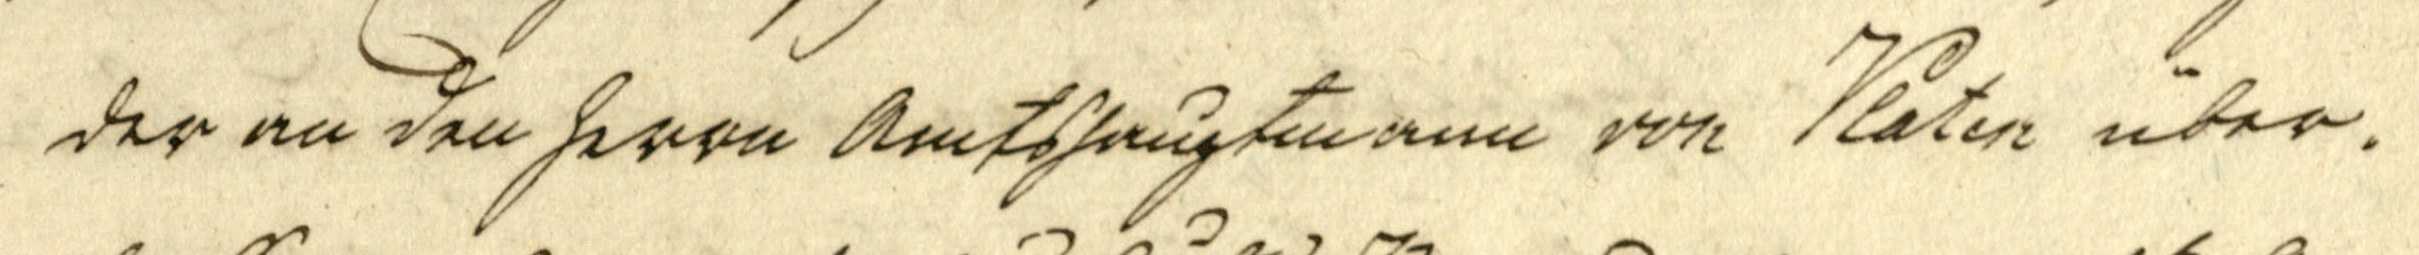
der an den Herrn Amtshauptmann von Platen über¬
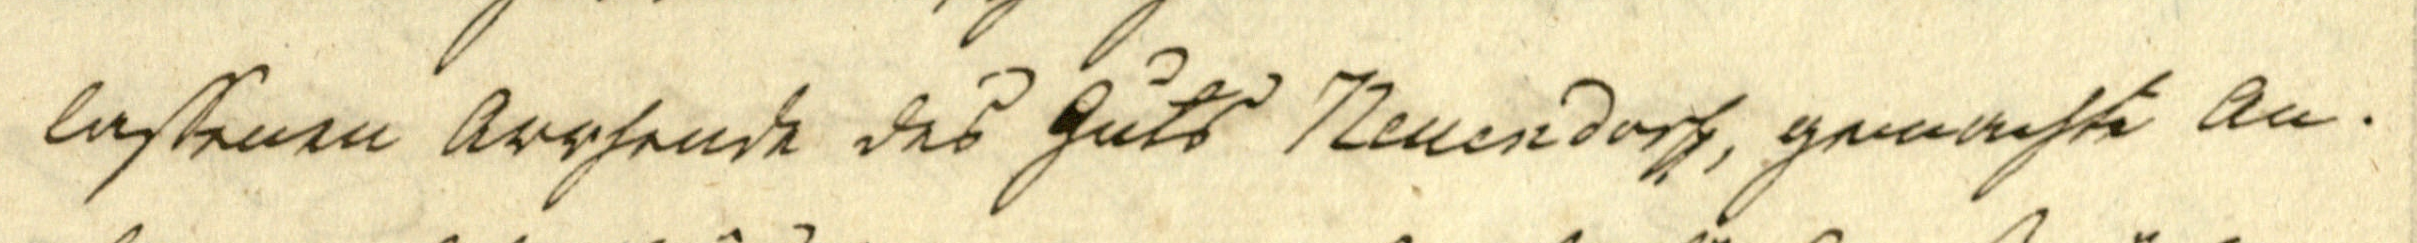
lassenen Arrhende des Guts Neuendorff, gemachte An¬
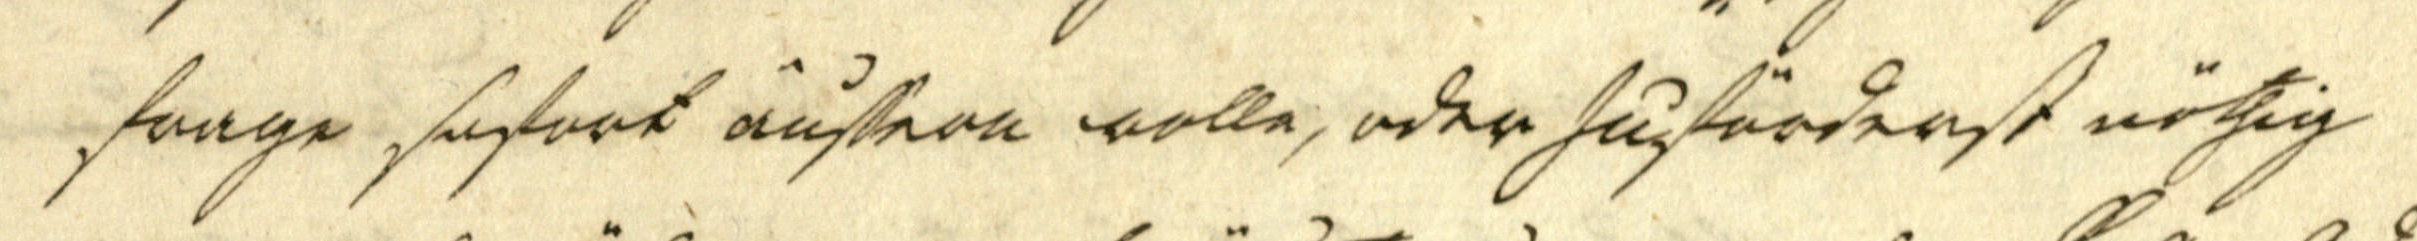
fragen sofort äussern wolle, oder zuförderst nöthig
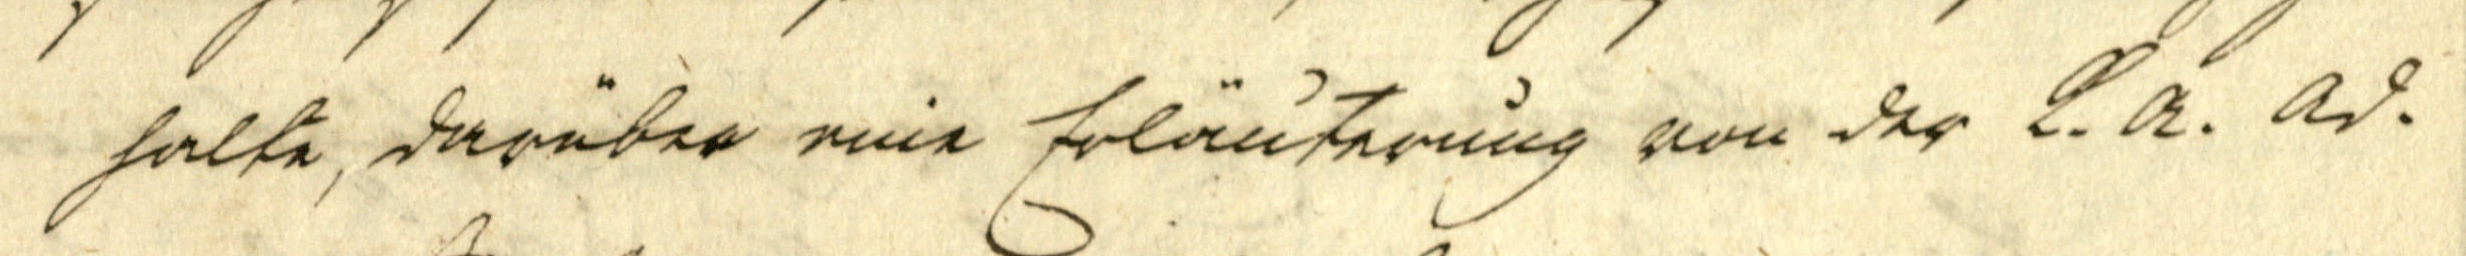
halte, darüber eine Erläuterung von der K. A. Ad¬
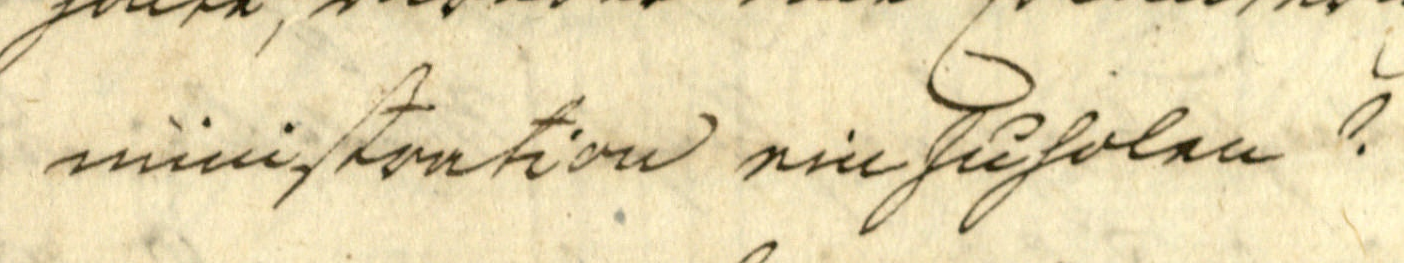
ministration einzuholen?
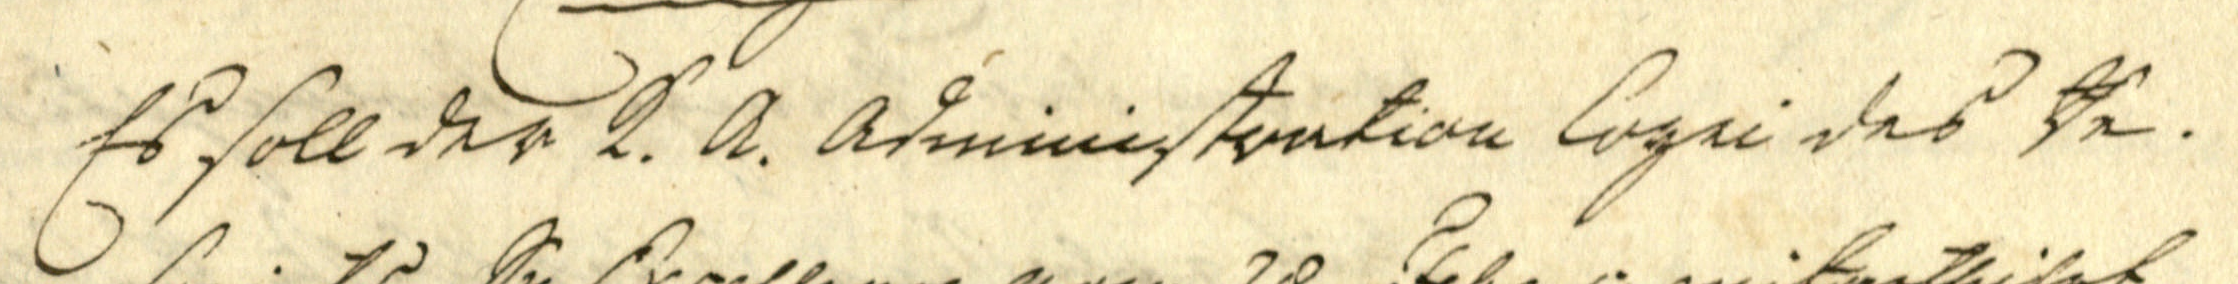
Es soll der K. A. Administration Copei des Re¬
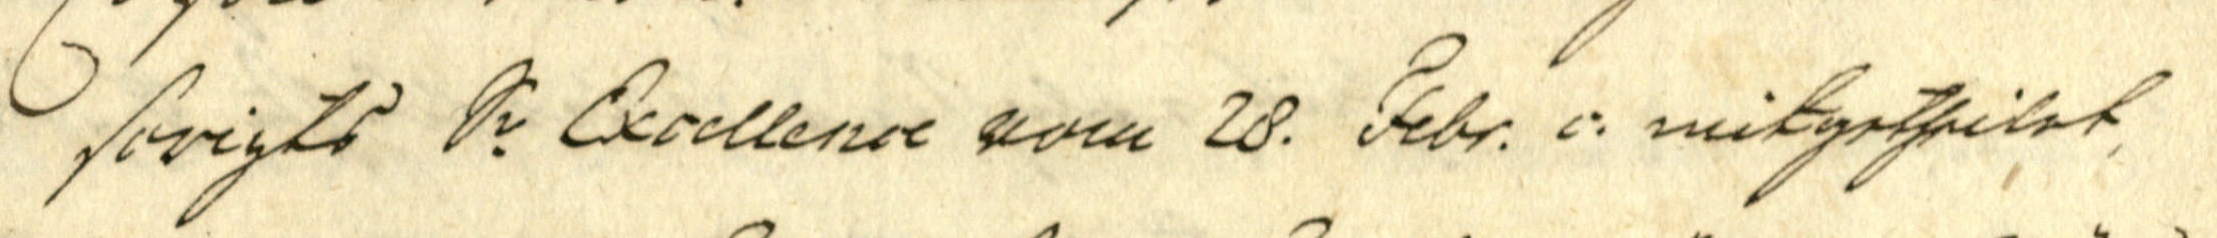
scripts Sr Excellence vom 28. Febr. c. mitgetheilet,
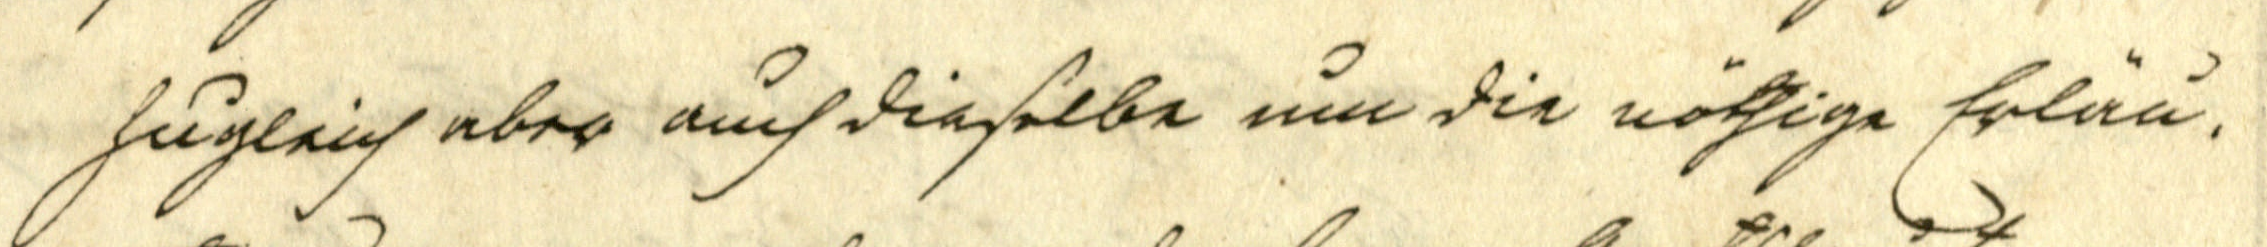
zugleich aber auch dieselbe um die nöthige Erläu¬
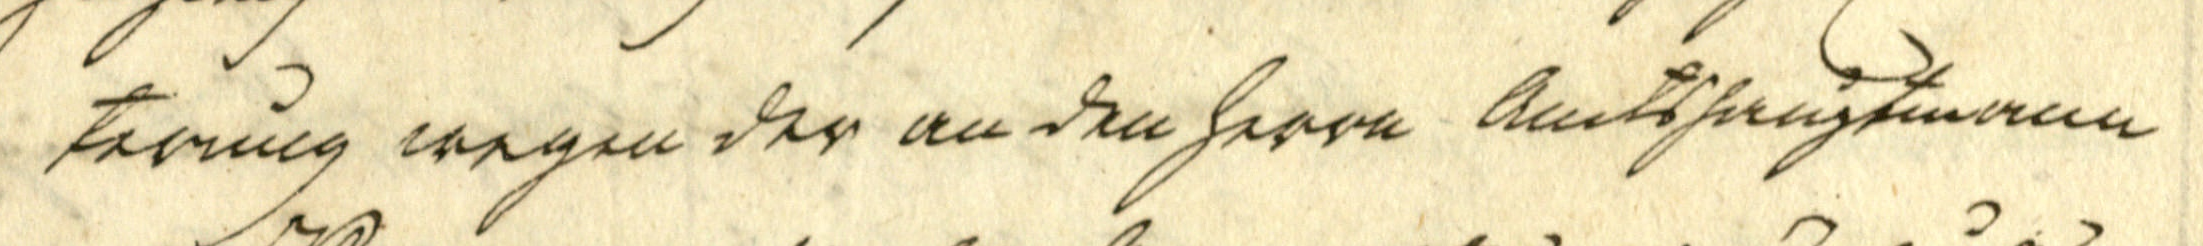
terung wegen der an den Herrn Amtshauptmann
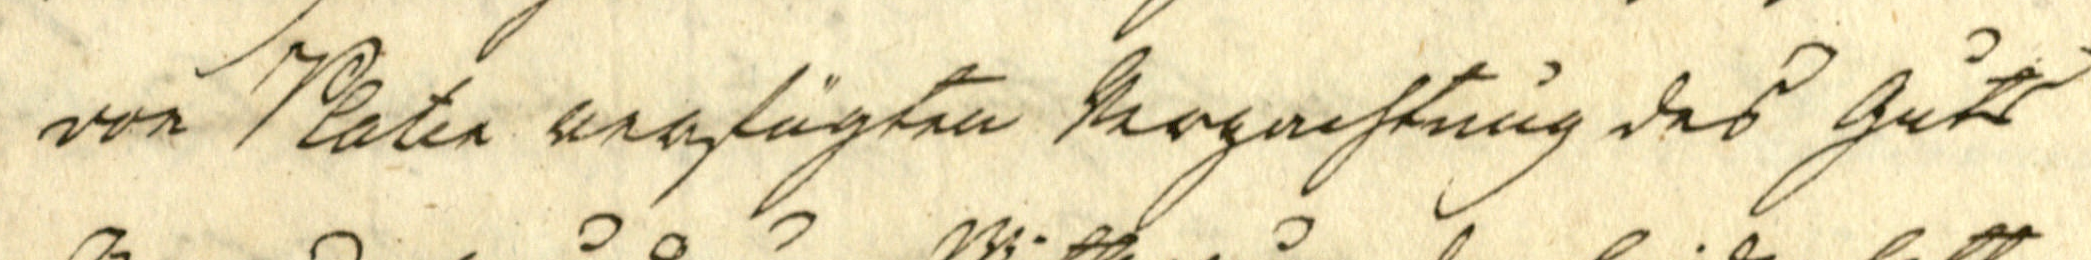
von Platen verfügten Verpachtung des Guts
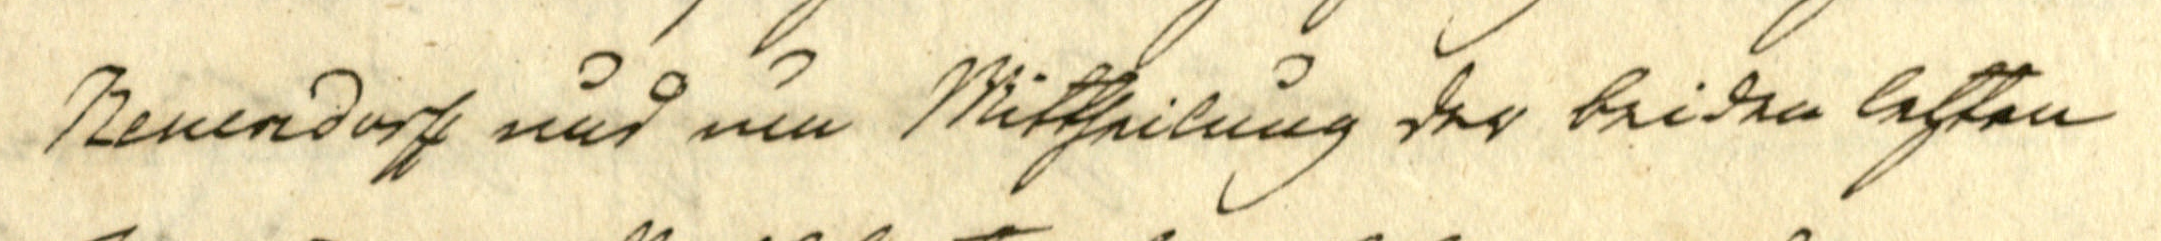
Neuendorff und um Mittheilung der beiden letzten
